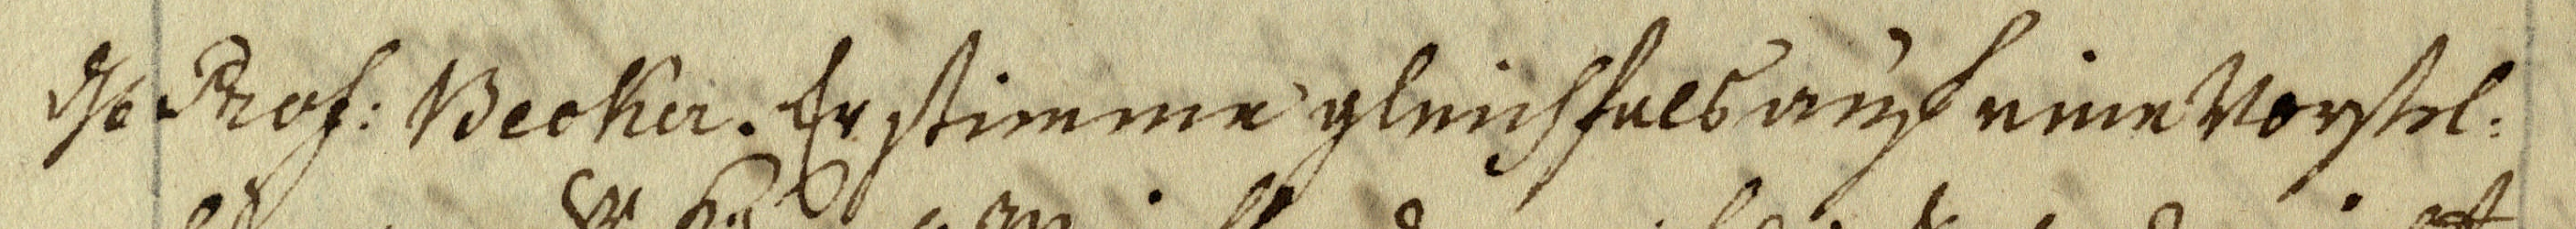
dh Prof. Becker. Er stimme gleichfals auf eine Vorstel¬
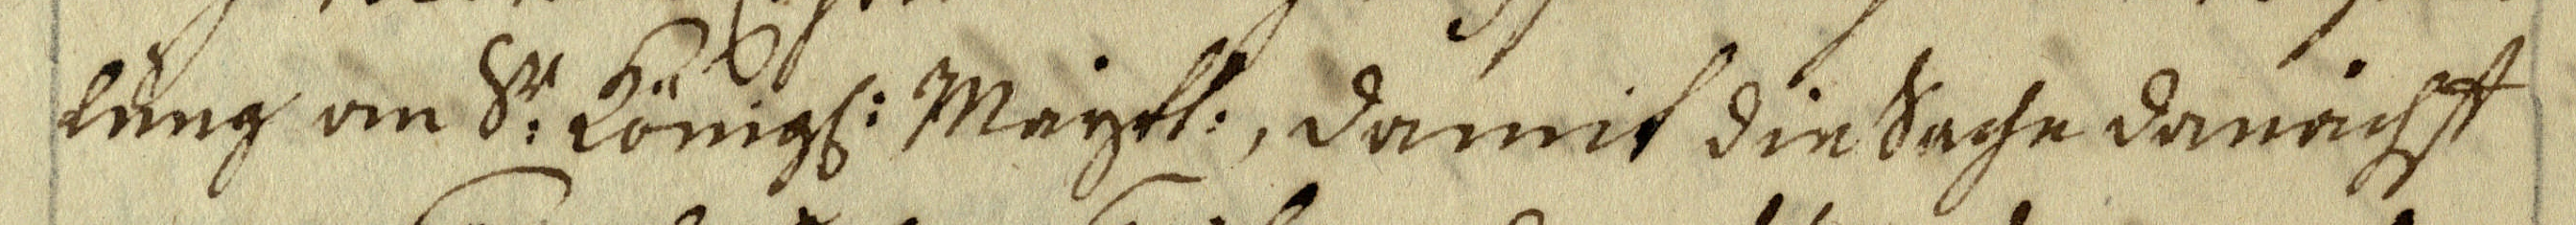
lung an Sr Königl. Maÿtt., damit die Sache danächst
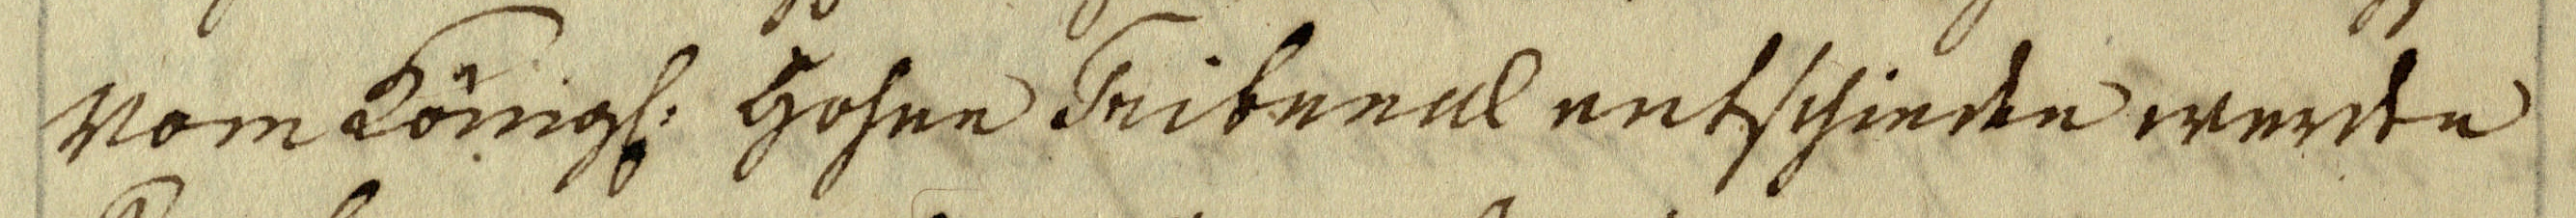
vom Königl. Hohen Tribunal entschieden werden
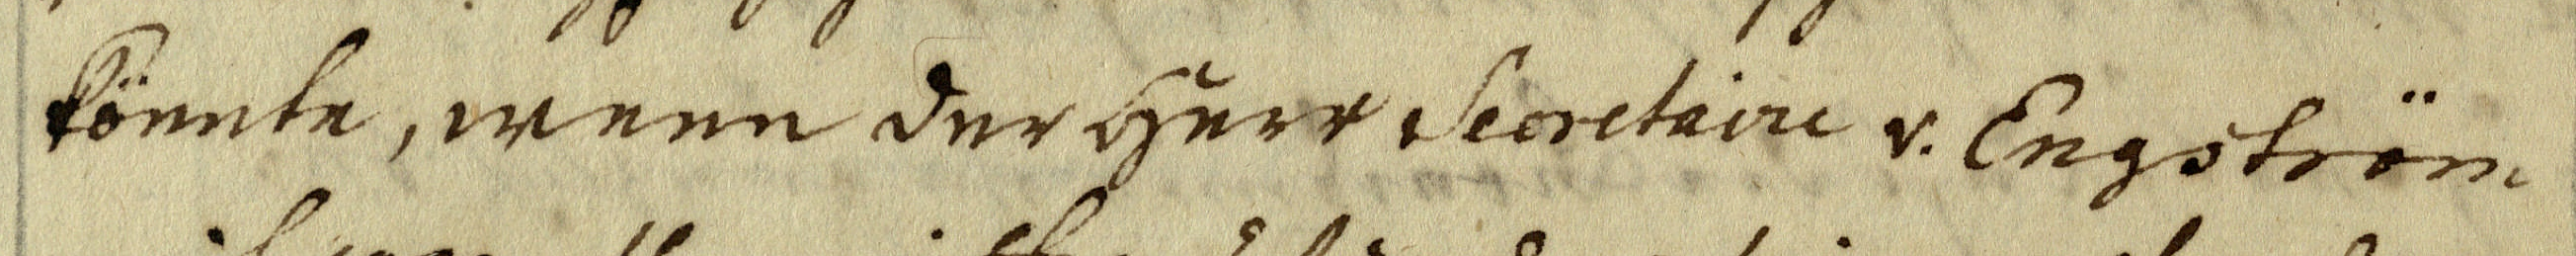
könnte, wenn der Herr Secretaire v. Engström
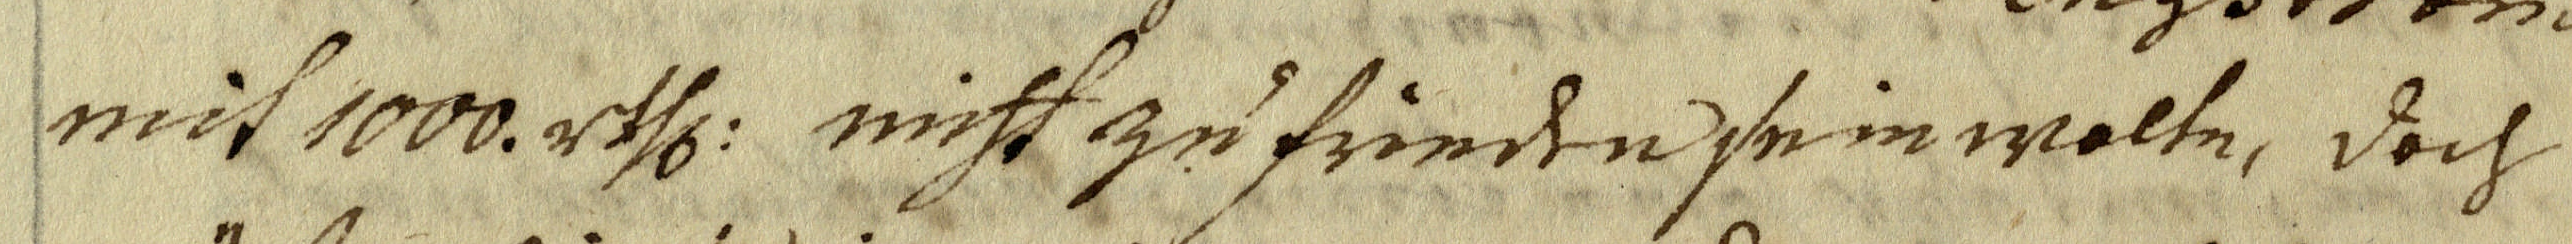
mit 1000. rth nicht zufrieden sein wolte, doch
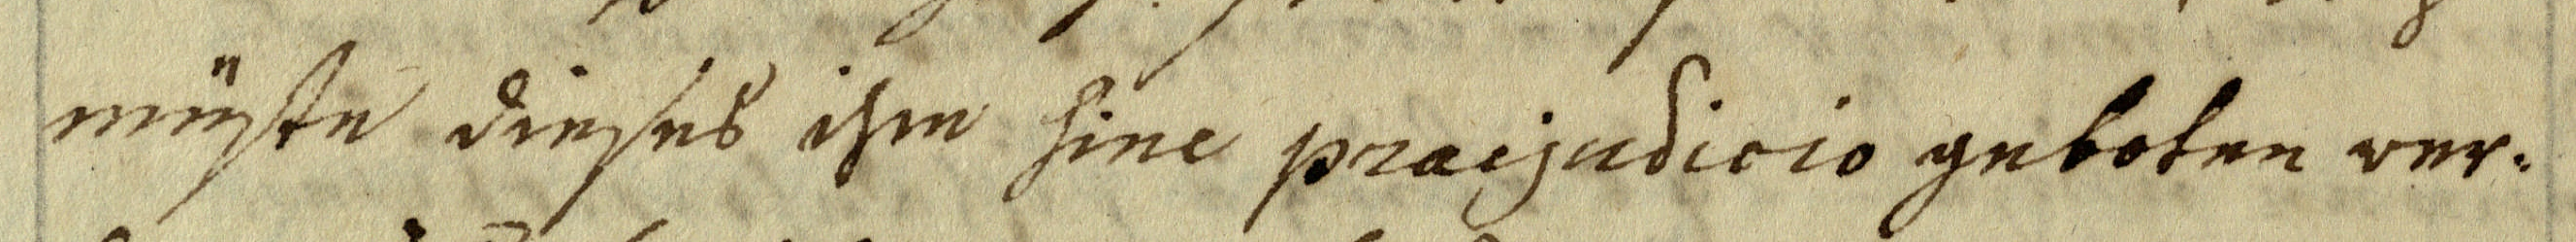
müste dieses ihm sine praejudicio geboten wer¬
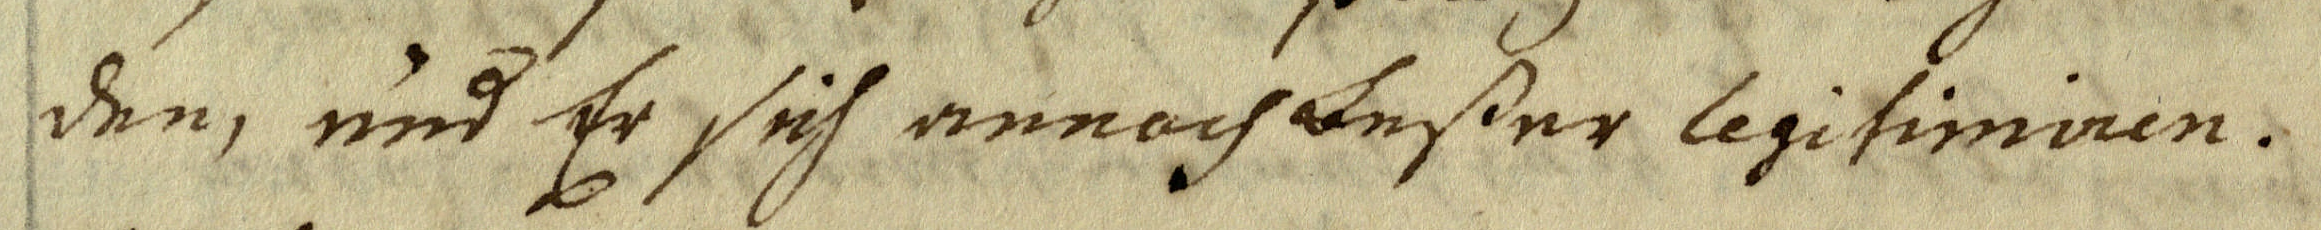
den, und Er sich annoch beßer legitimiren.
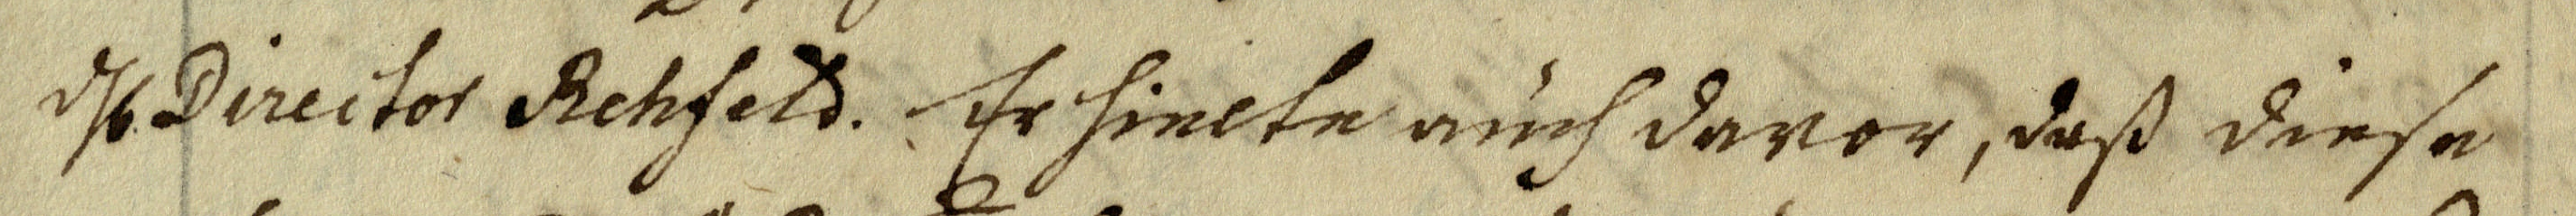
dh Director Rehfeld. Er hielte auch davor, daß diese
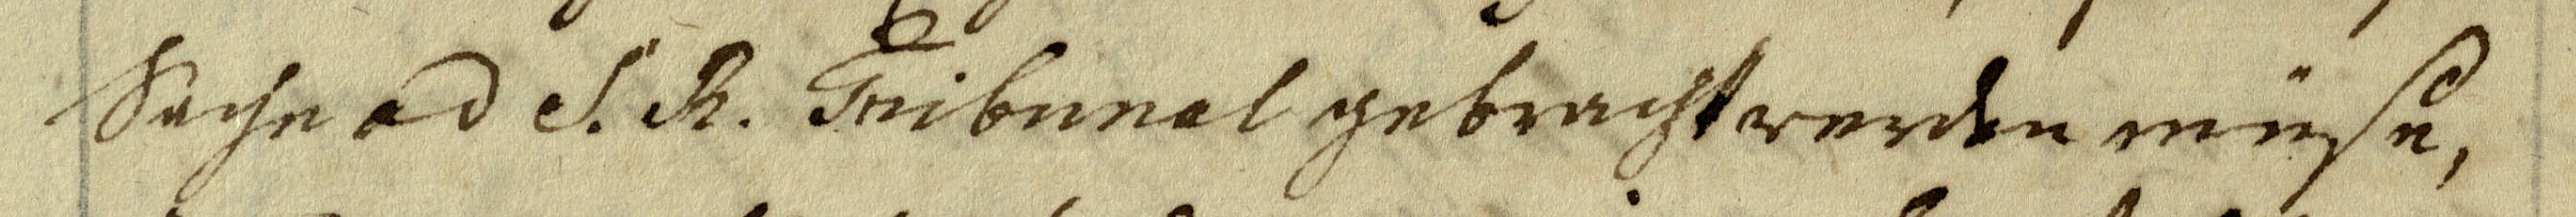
Sache ad S. R. Tribunal gebracht werden müße,
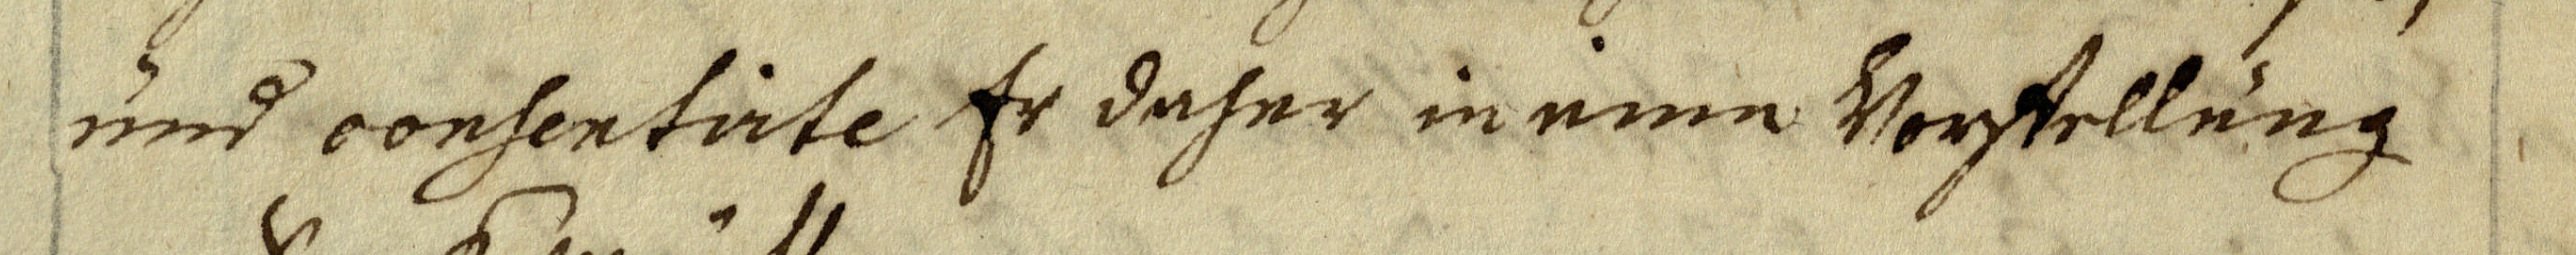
und consentirte Er daher in eine Vorstellung
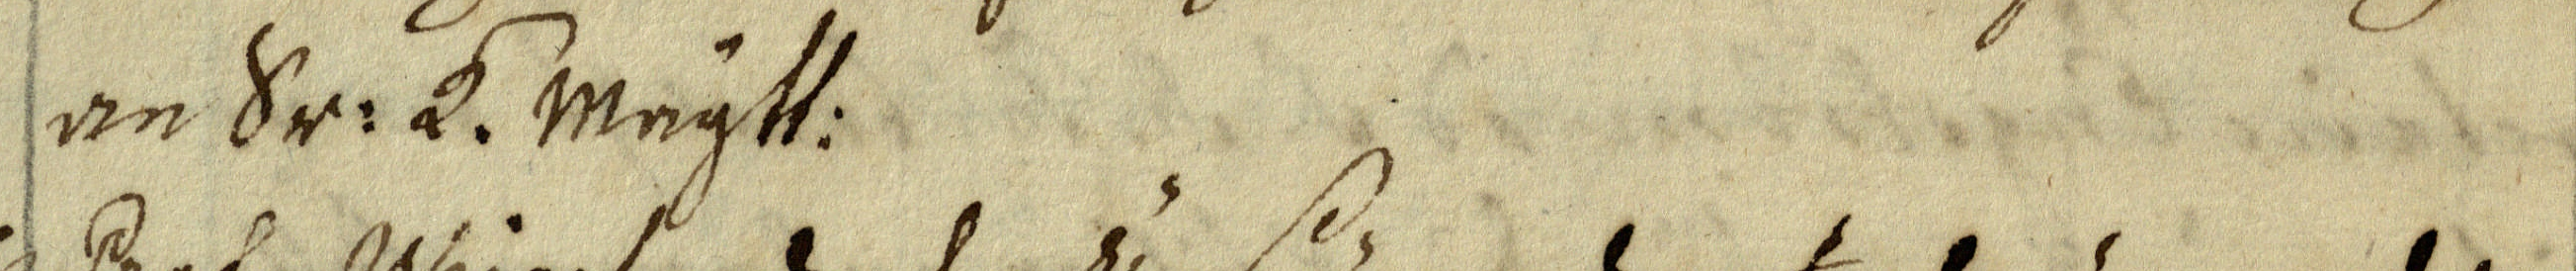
an Sr. K. Maÿtt.
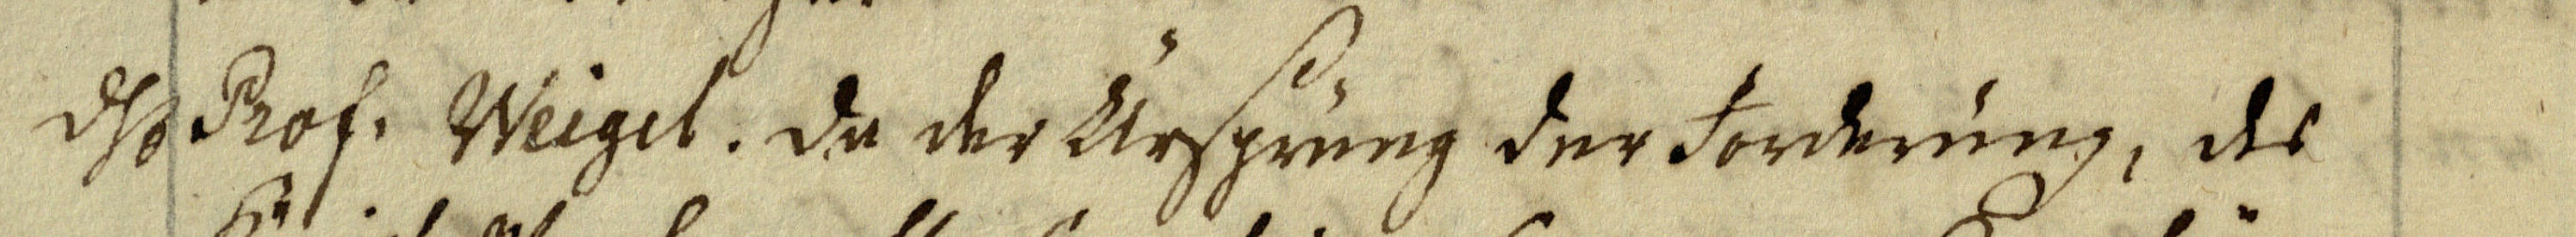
dh Prof. Weigel. Da der Ursprung der Forderung, des
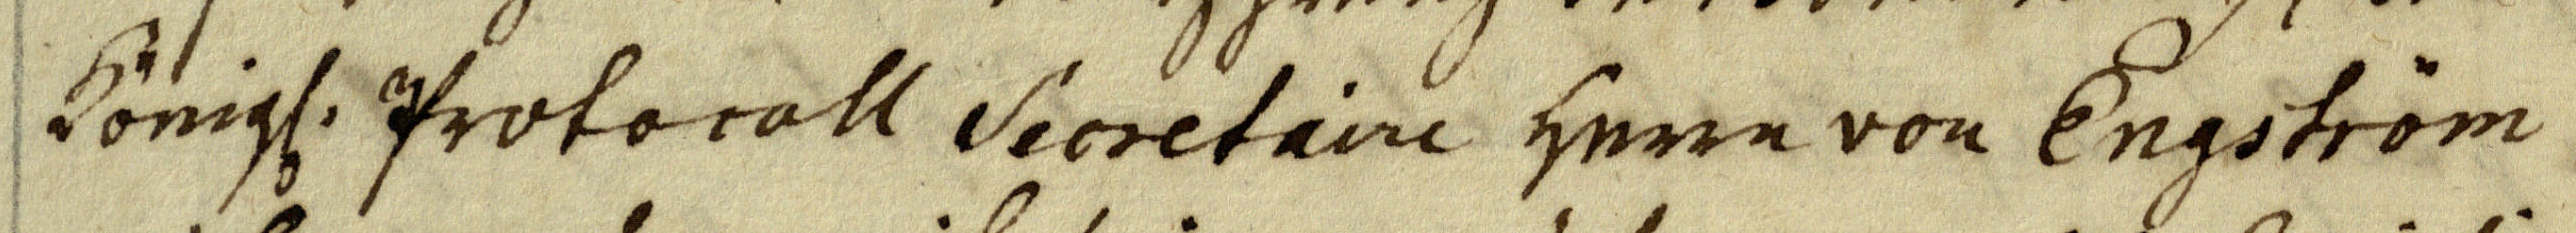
Königl. Protocoll Secretaire Herrn von Engström
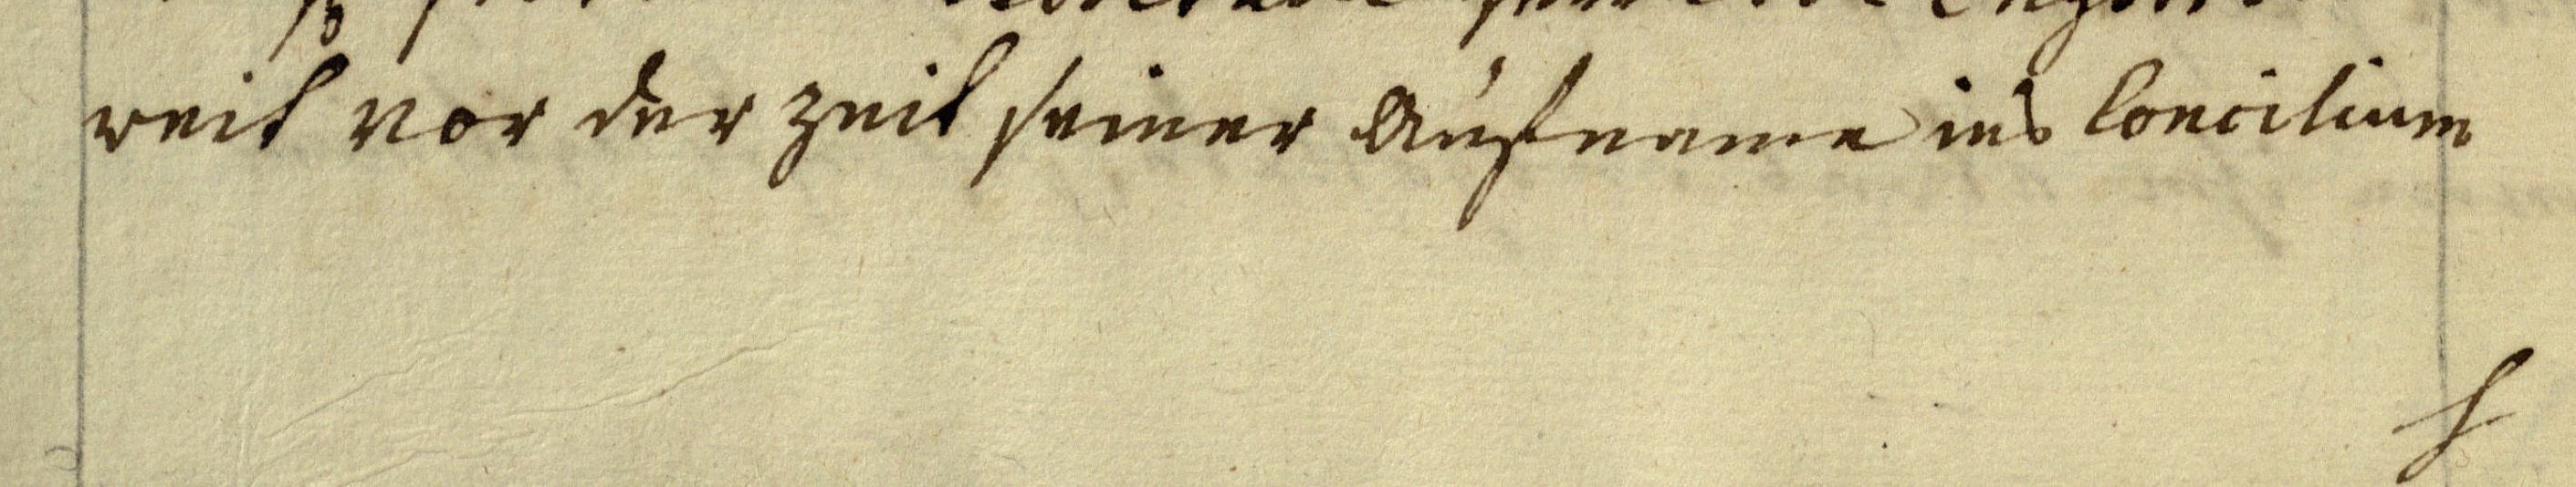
weit vor der Zeit seiner Aufname ins Concilium
